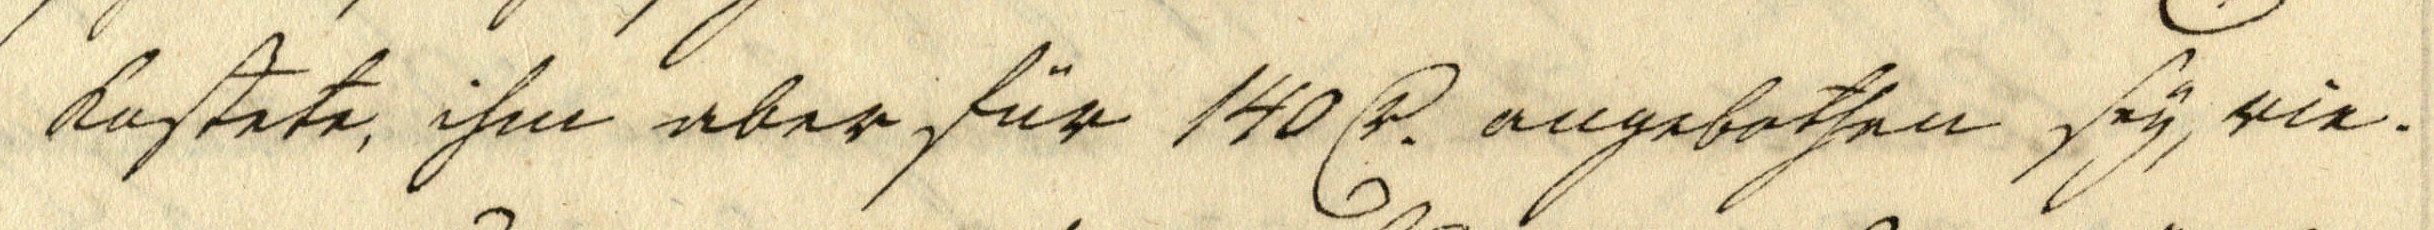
kostete, ihm aber für 140 rtl. angebothen sey, vie-
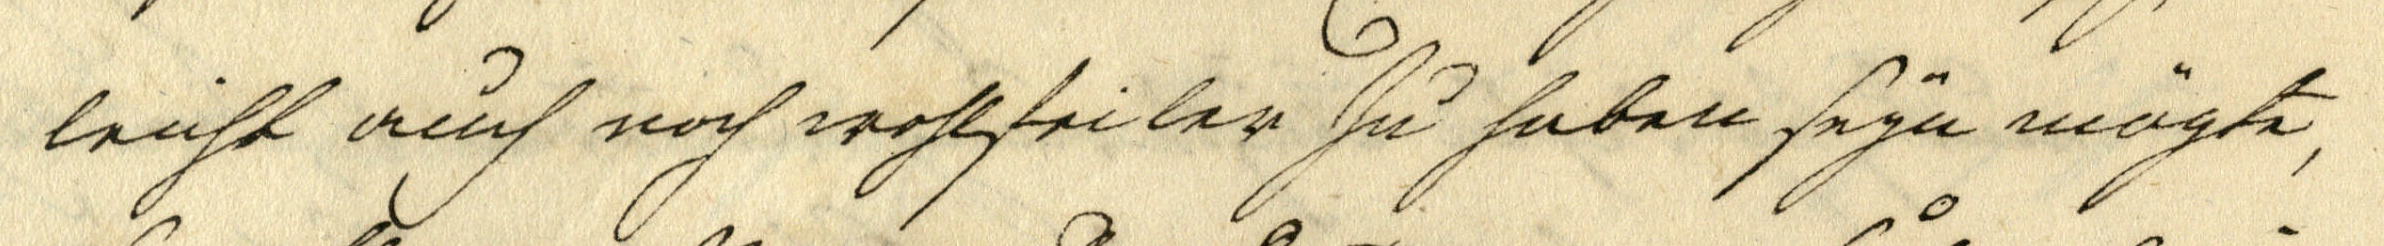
leicht auch noch wohlfeiler zu haben seyn mögte,
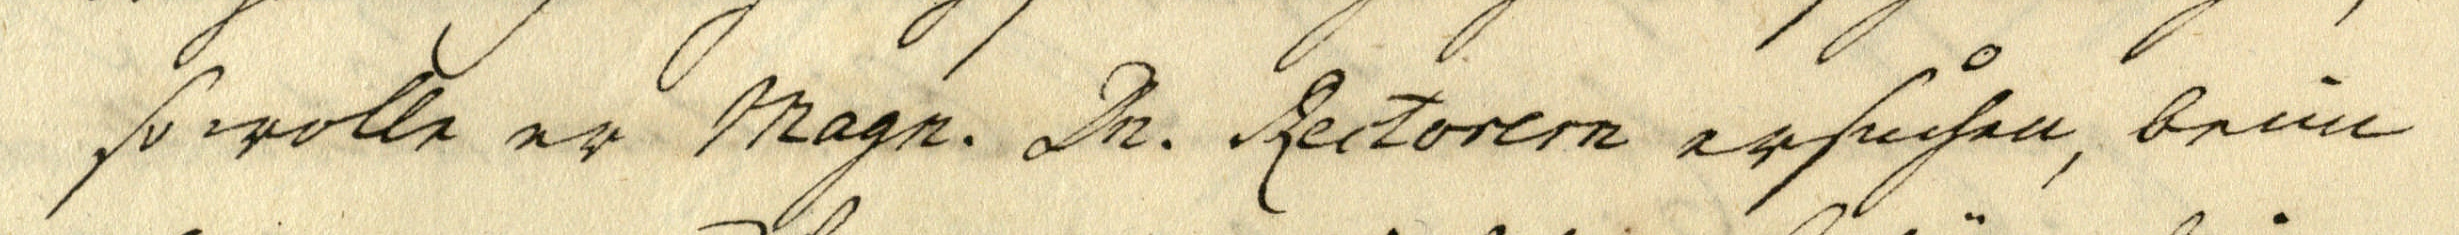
so wolle er Magn. Dn. Rectorem ersuchen, beim
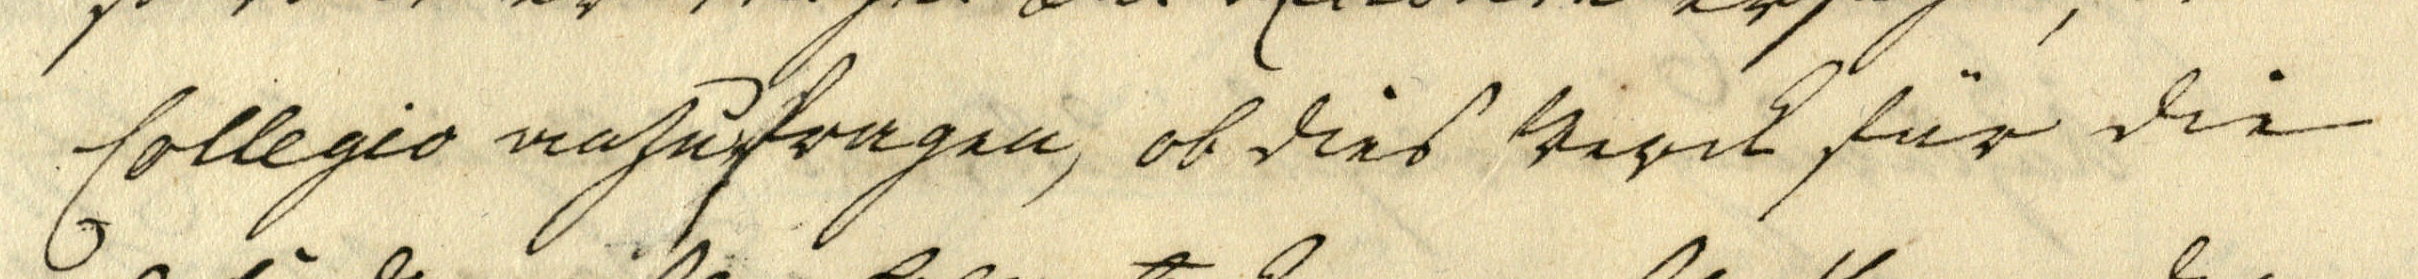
Collegio nachzufragen, ob dies Werck für die
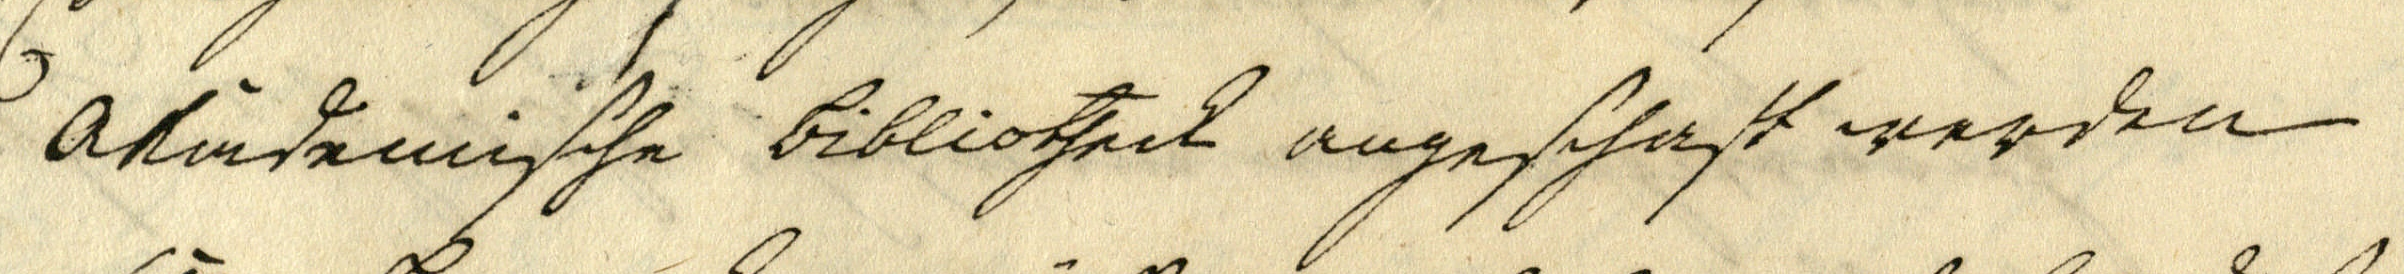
Akademische Bibliothek angeschaft werden
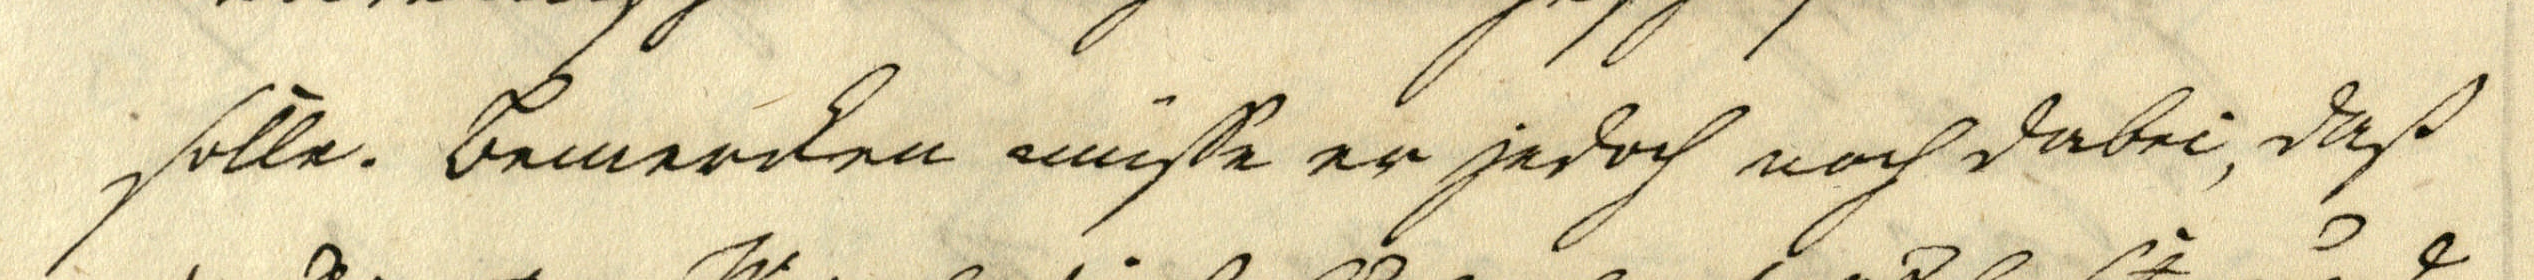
solle. Bemerken müsser er jedoch noch dabei, daß
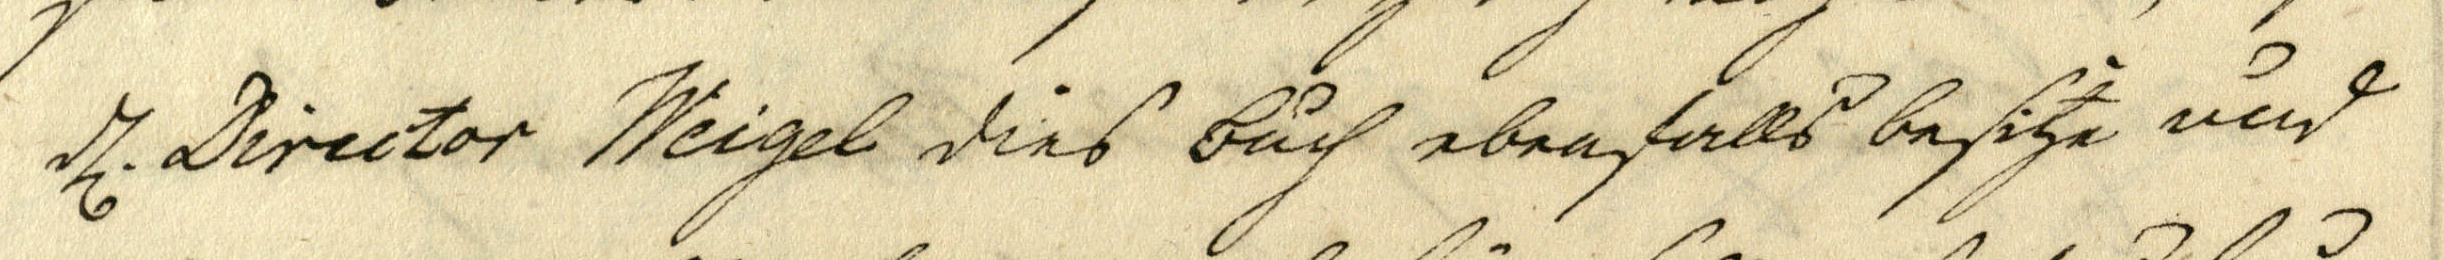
d.h. Director Weigel dies Buch ebenfalls besitze und
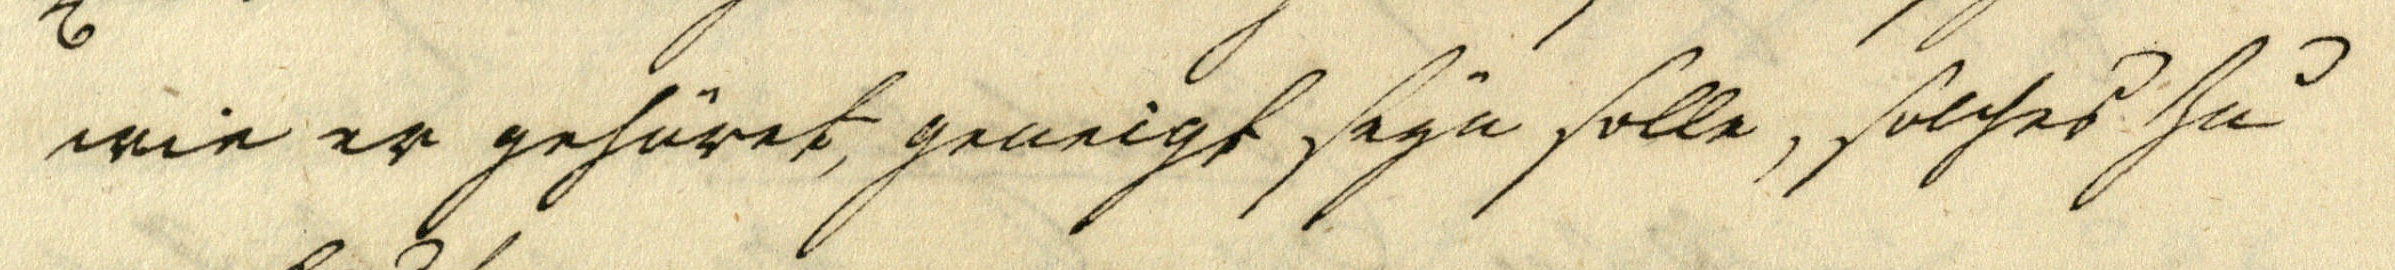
wie er gehöret, geneigt seyn solle, solches zu
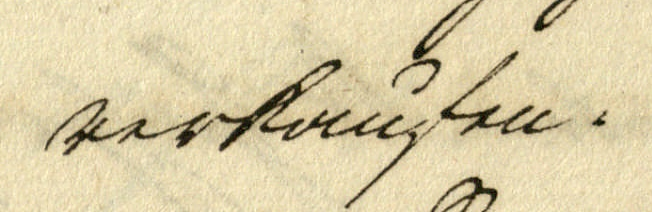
verkaufen.
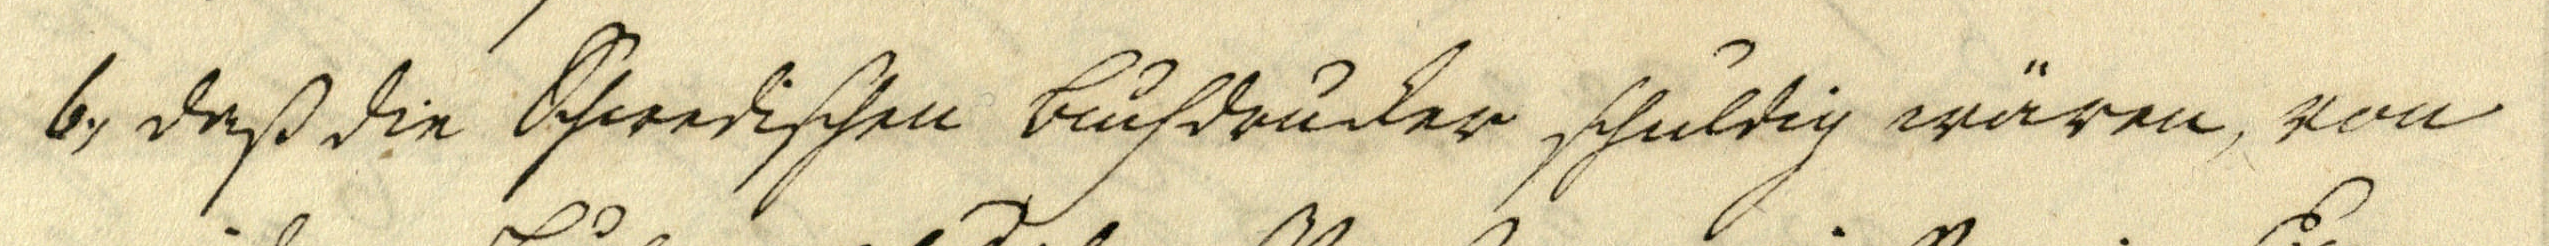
b., daß die Schwedischen Buchdrucker schuldig wären, von
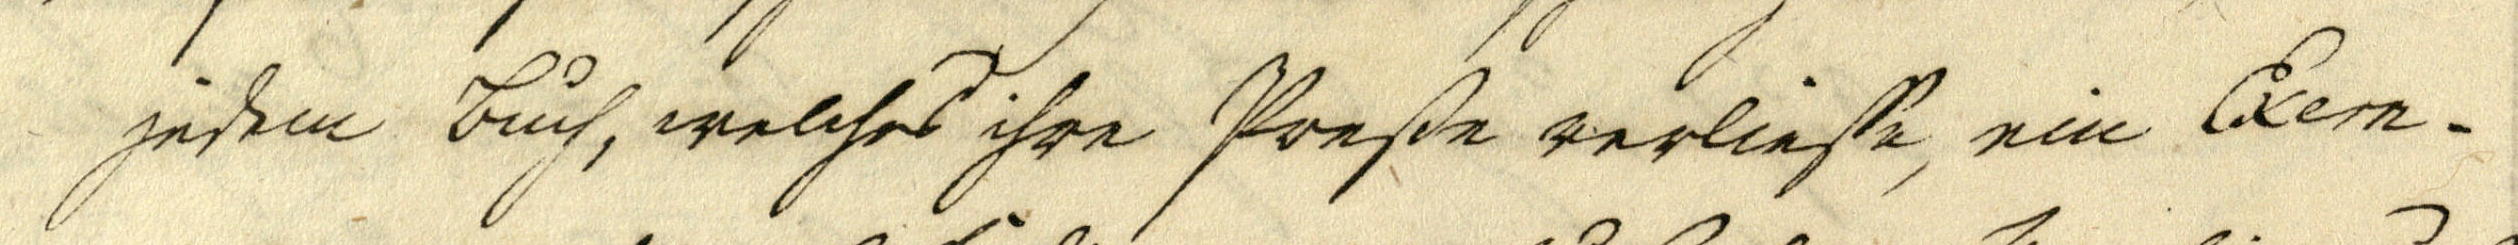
jedem Buch, welches ihre Presse verliesse, ein Exem-
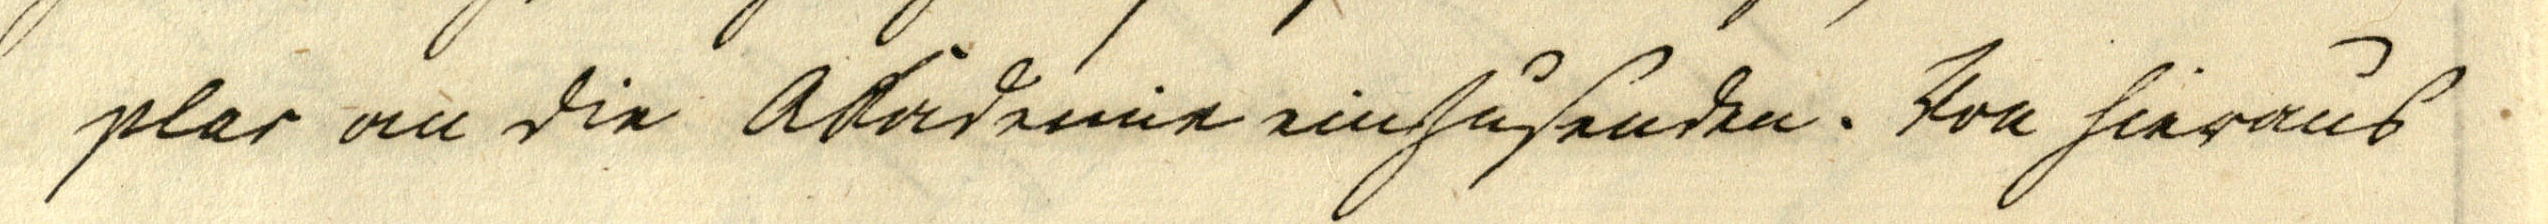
plar an die Akademie einzusenden. Von hieraus
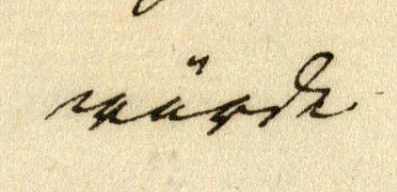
würde
